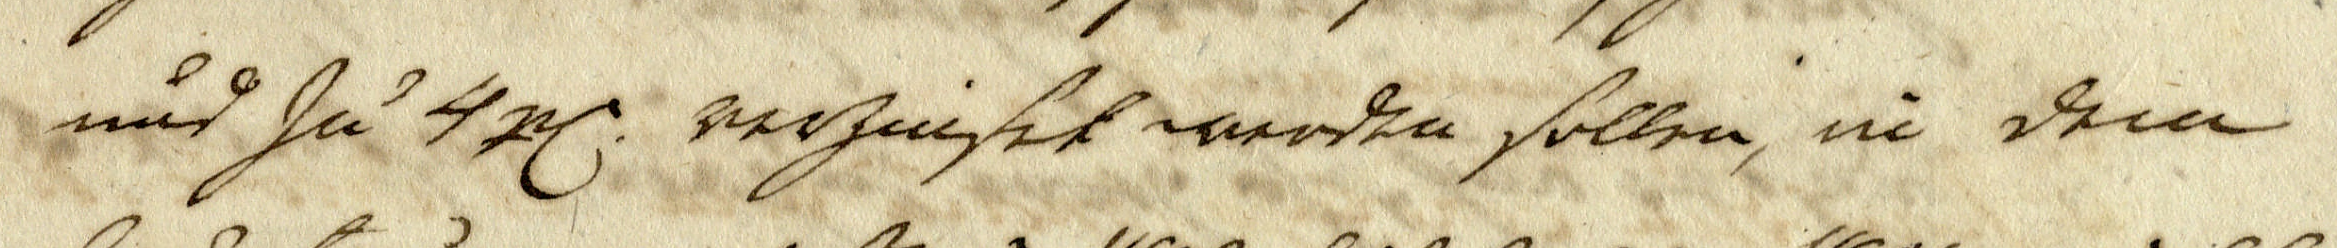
und zu 4 pl. verzinset werden sollen, in dem
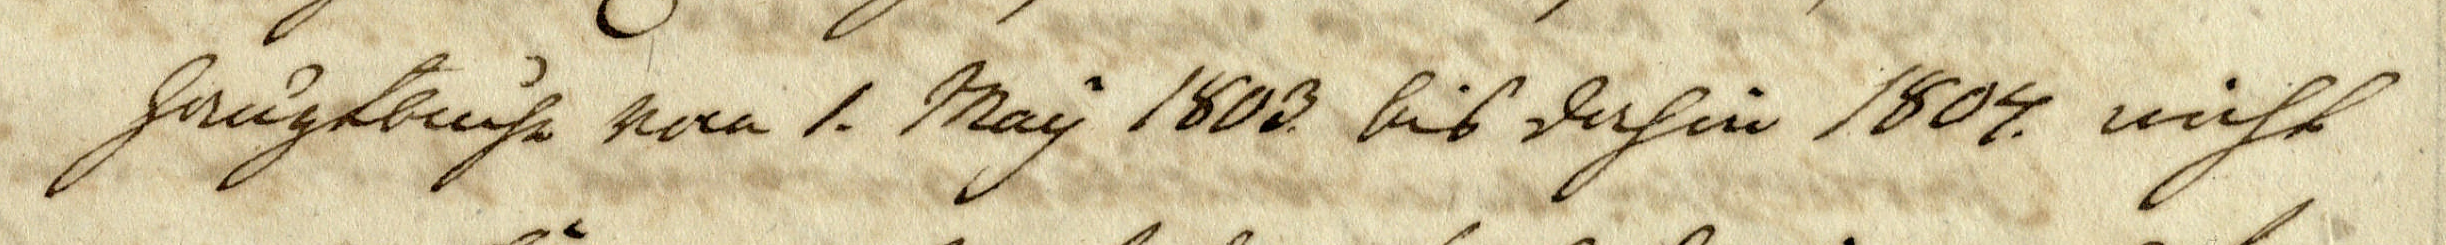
Hauptbuche vom 1. Maÿ 1803 bis dahin 1804. nicht
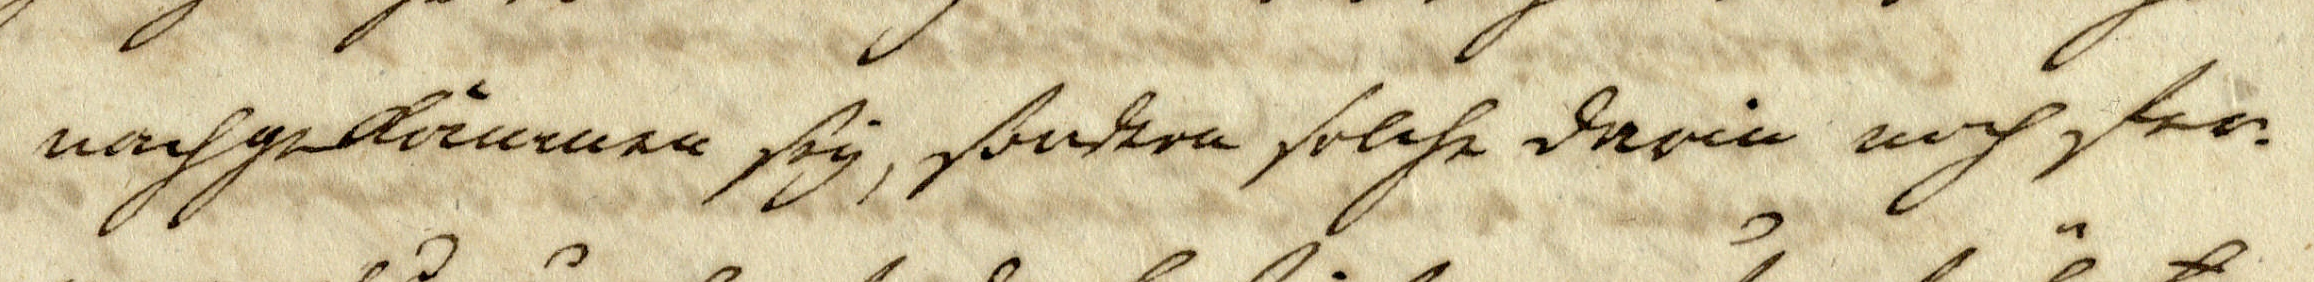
nachgekommen seÿ, sondern solche darin noch fer¬
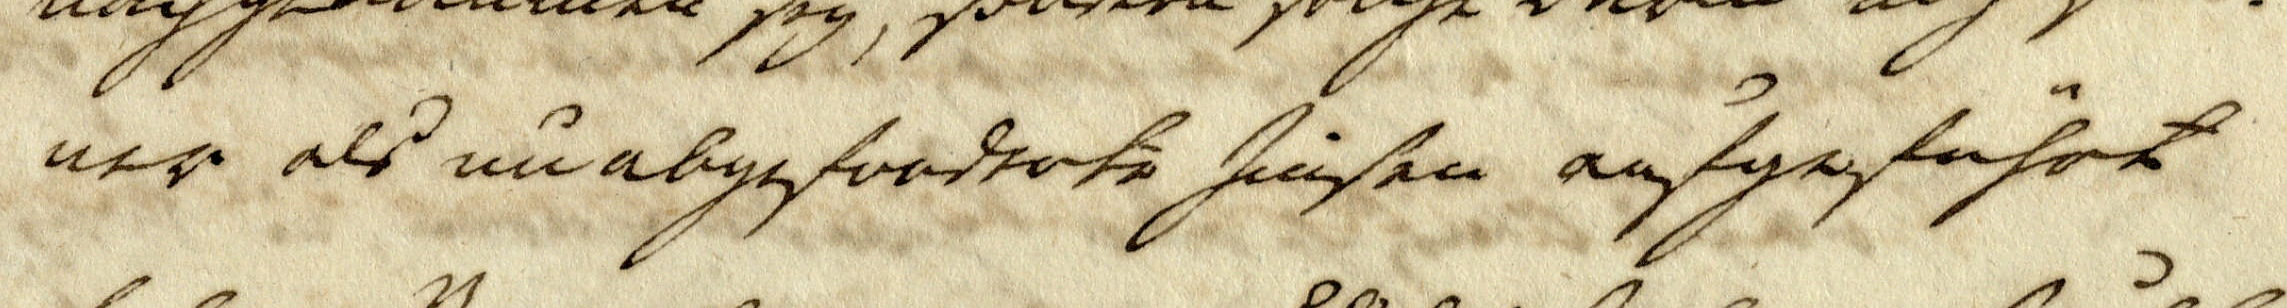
ner als unabgeforderte Zinsen aufgeführt
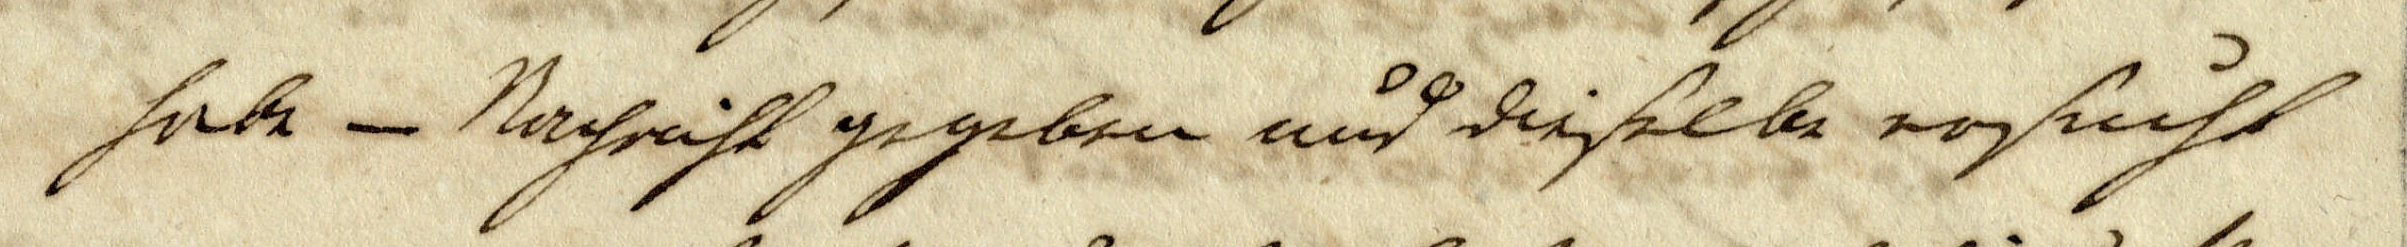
habe - Nachricht gegeben und dieselbe ersucht
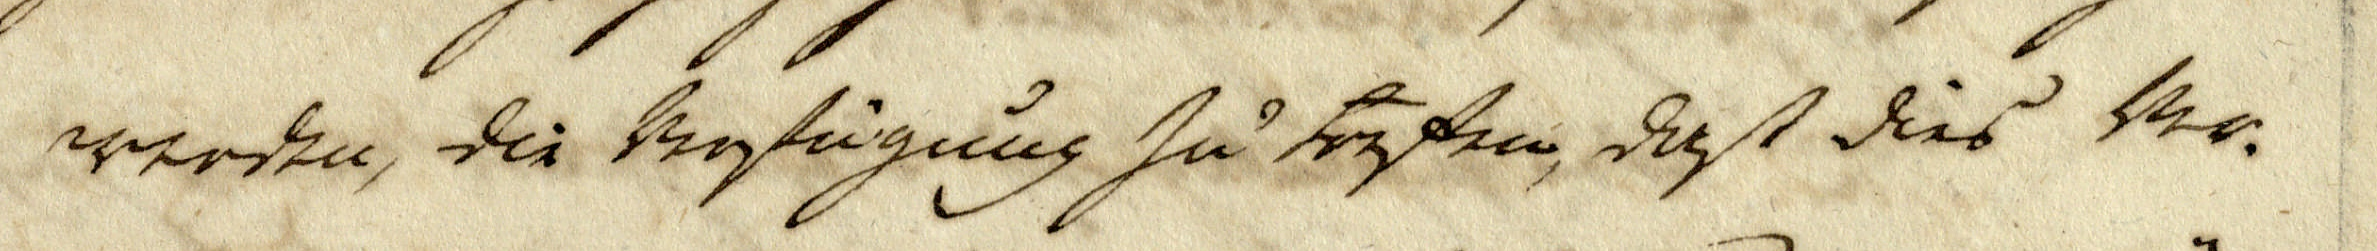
werden, die Verfügung zu trefen, daß dies Ver¬
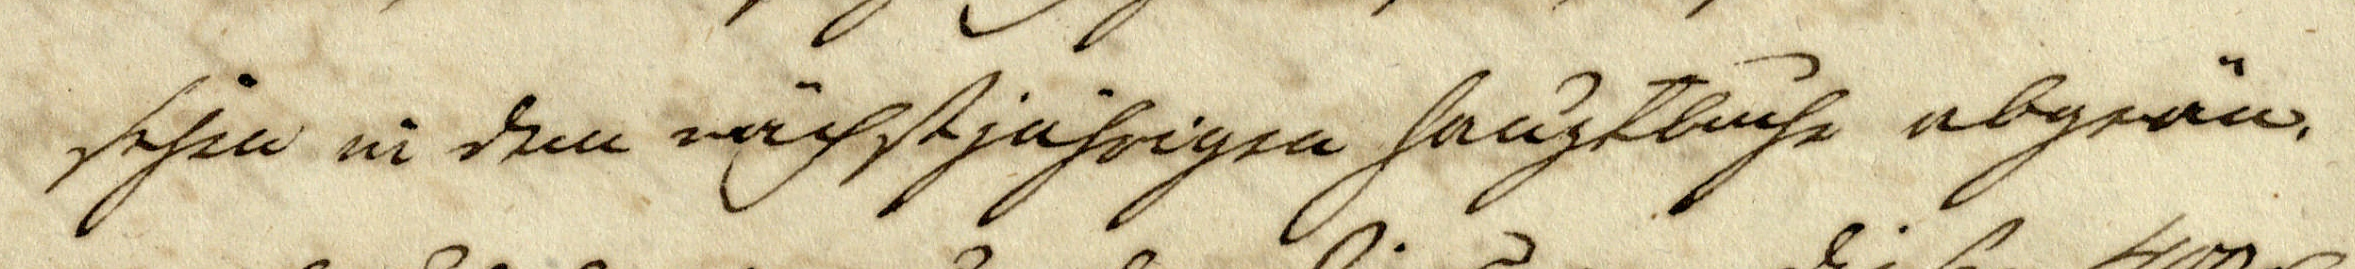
sehen in dem nächstjährigen Hauptbuche abgeän¬
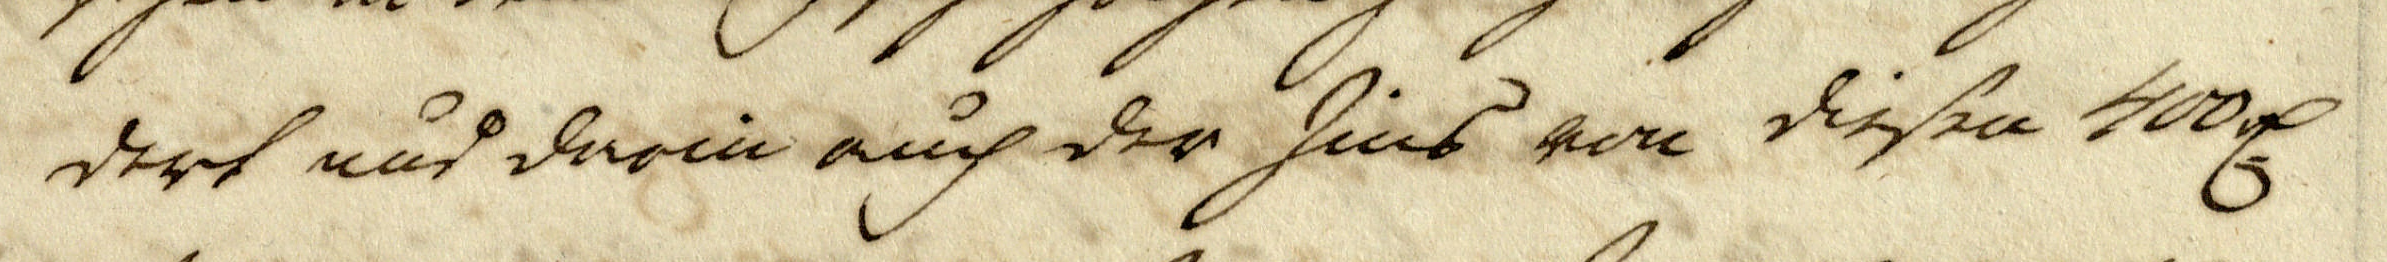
dert und darin auch der Zins von diesen 400 l.
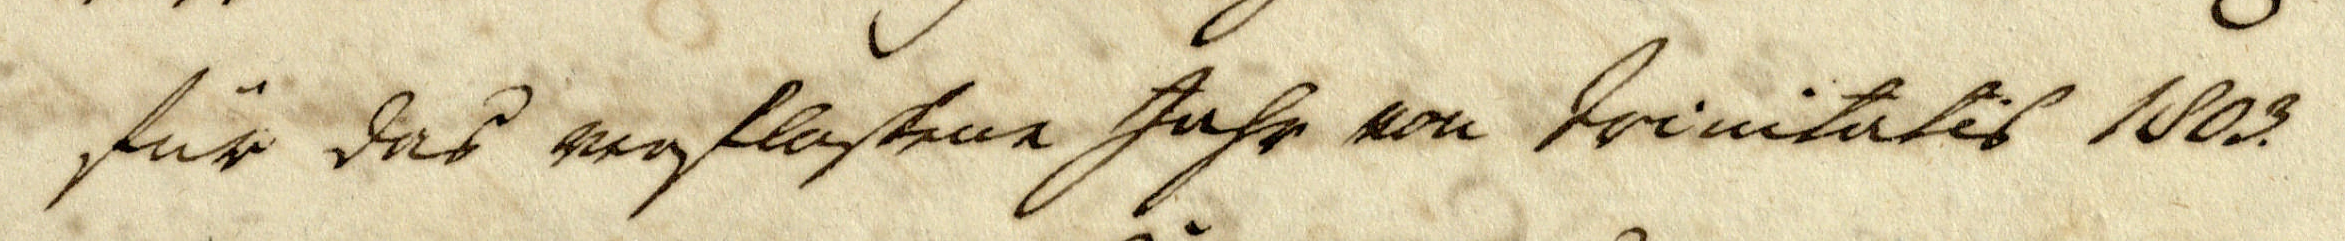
für das verflossene Jahr von Trinitatis 1803
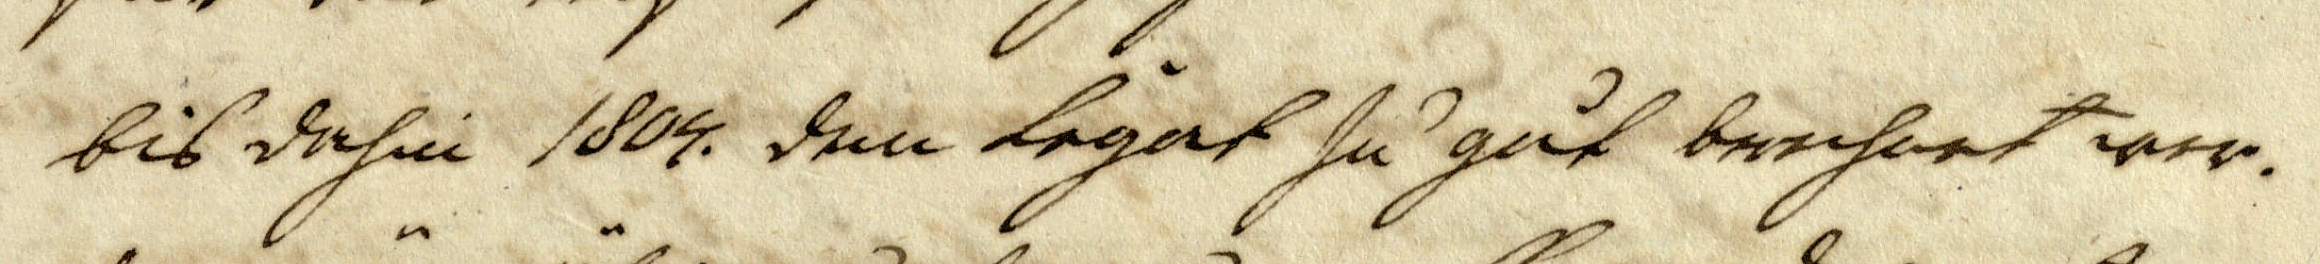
bis dahin 1804. dem Legat zu gut berechnet wer¬
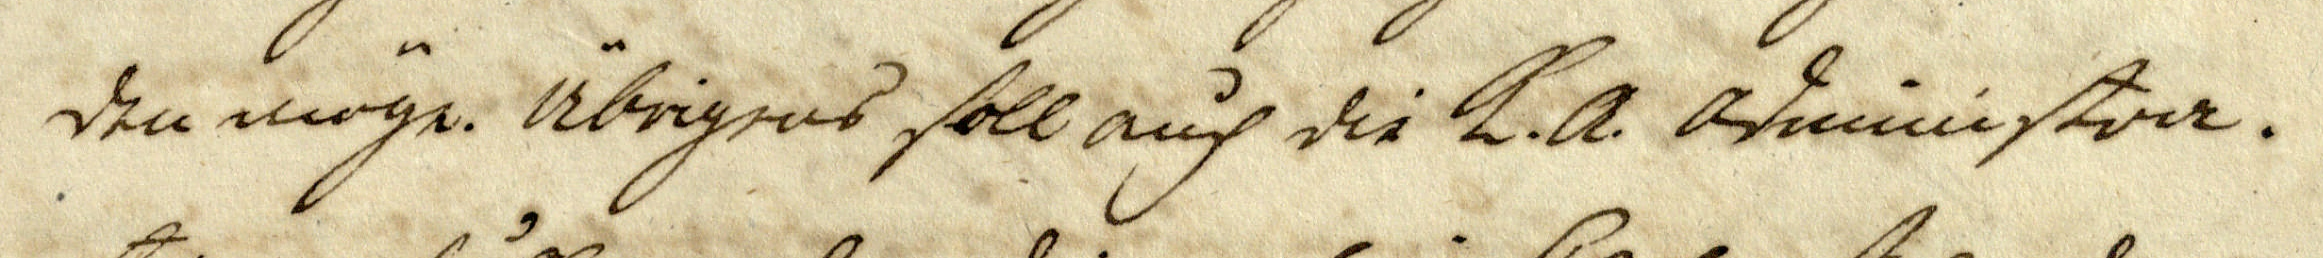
den möge. Übrigens soll auch die K. A. Administra¬
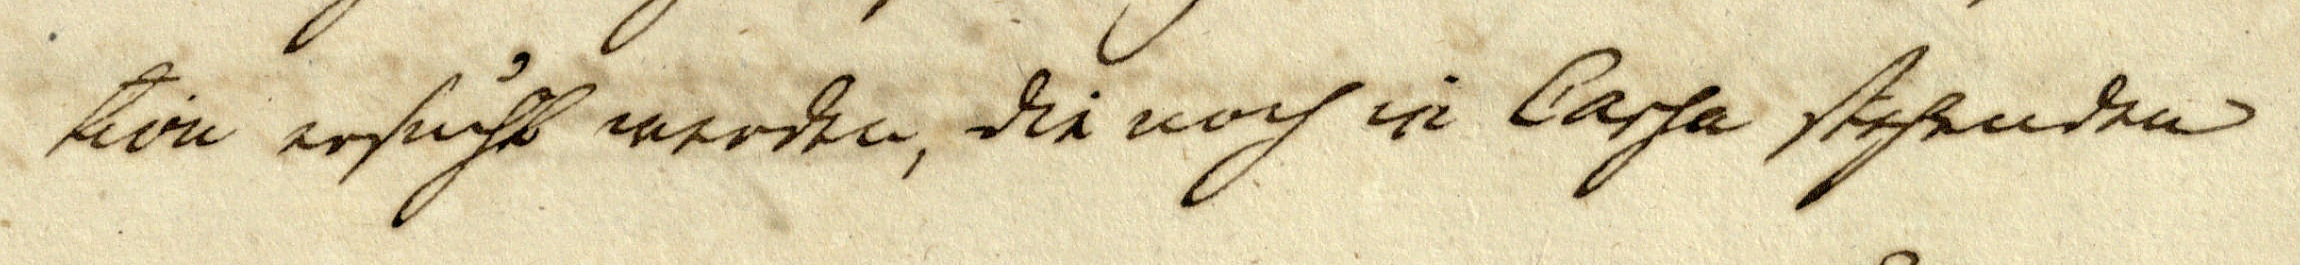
tion ersucht werden, die noch in Cassa stehenden
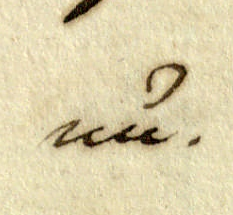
un
